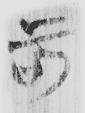可
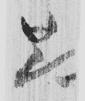也
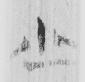少
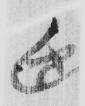臣
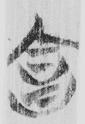合
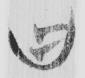曰
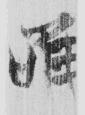唯
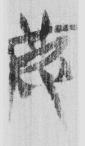皮
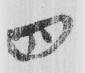四
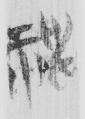神
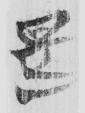是
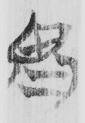胃
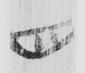四
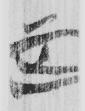正
